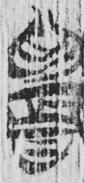○（鬲）
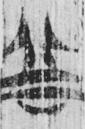丘
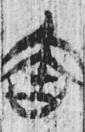匋（陶）
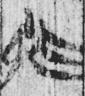於
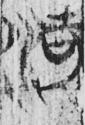河
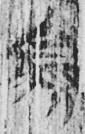賓（濱）
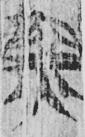魚（漁）
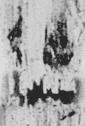於
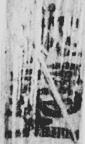○（雷）
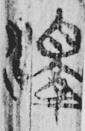澤
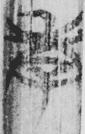孝
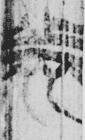羕（養）
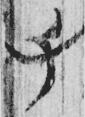父
